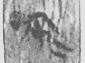九十=
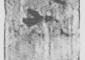九
